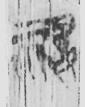禝
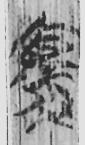褱
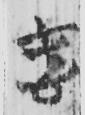{才心}
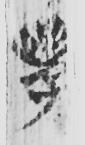{幽子}
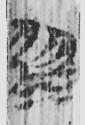溺
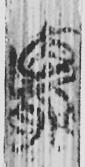{𣎆角}
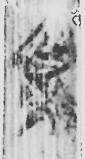寡（寡）
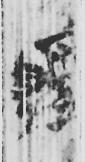{見巠}
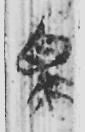蜀
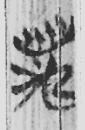萬
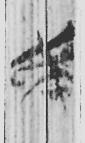民
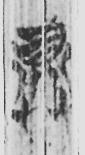具
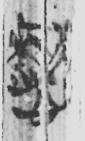{來臼犬心}
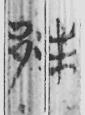邦
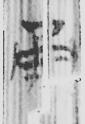甬
